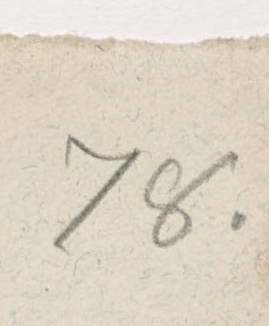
78.
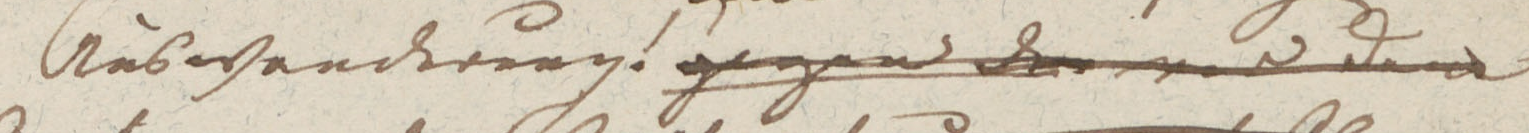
Auswanderung. um den Anfang gegen den vor demn
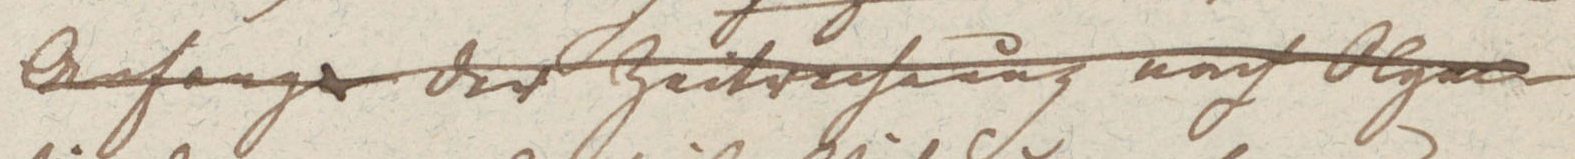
Anfange der Zeitrechnung nach Olym-
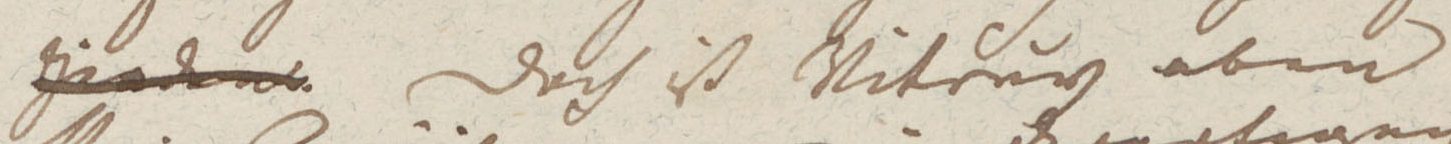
piaden Doch ist Vitruv eben
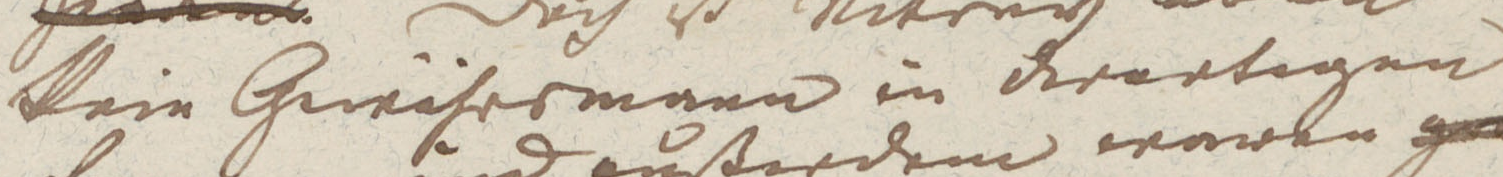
kein Gewährsmann in derartigen
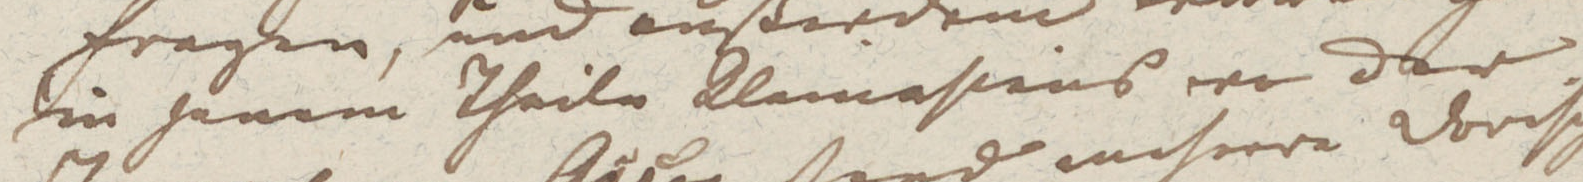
in jenem Theile Kleinasiens wo der
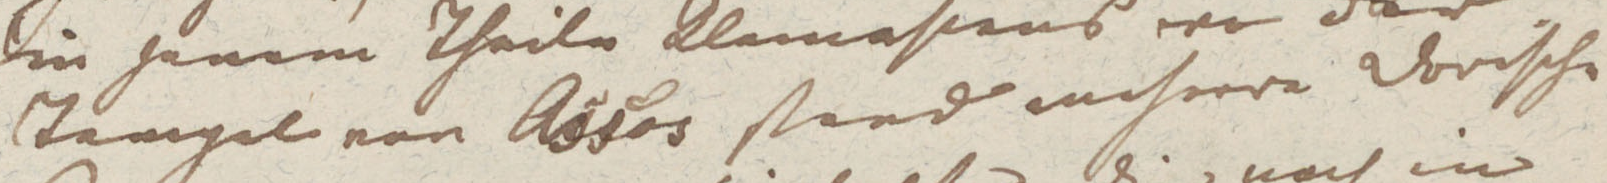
Tempel von Assos stand mehrere Dorische
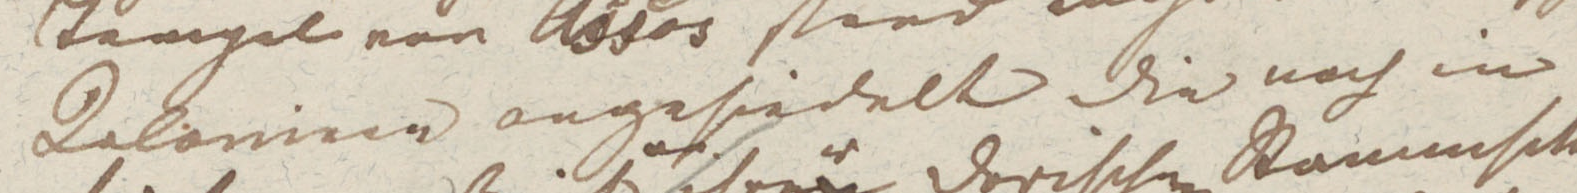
Kolonieen angesiedelt die noch in
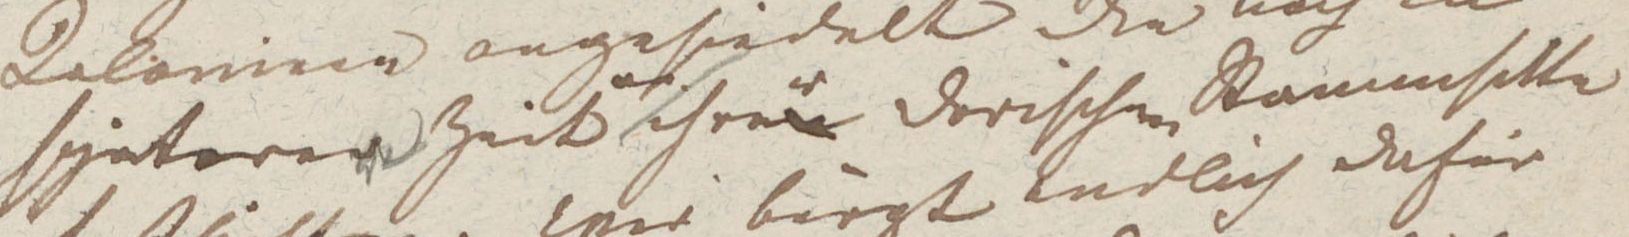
spätererr Zeit an ihrenr Dorischen Stammsitte
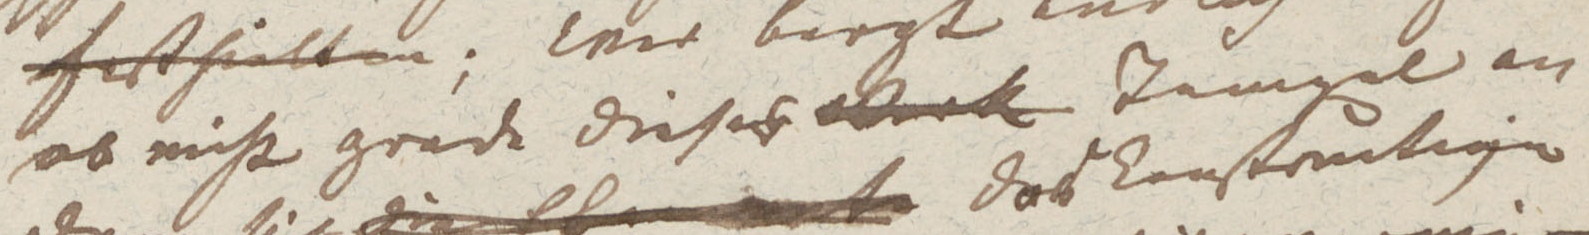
nicht grade diesesr Tempel an
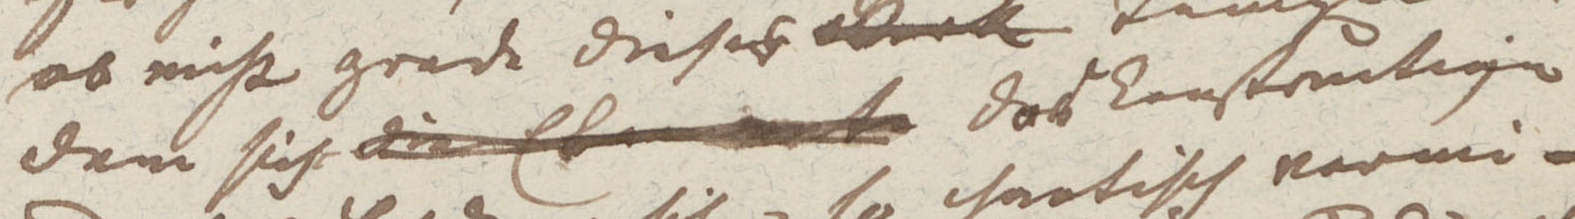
dem sich die Elemente deras Constructive
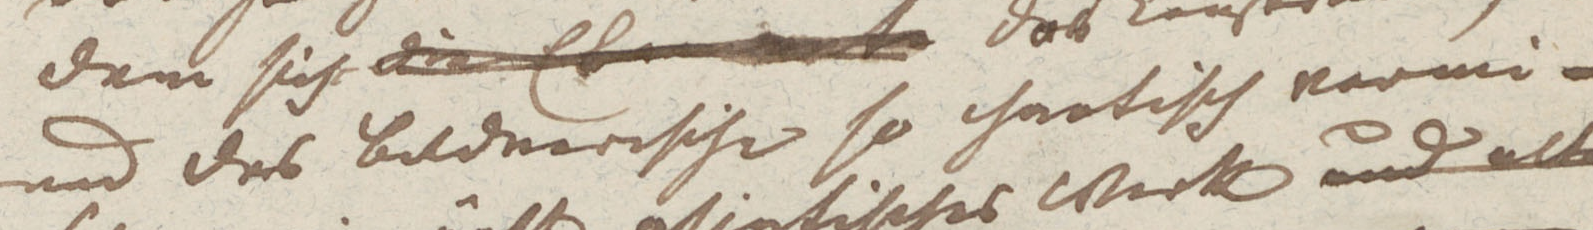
und das Bildnerische so chaotisch vermi-
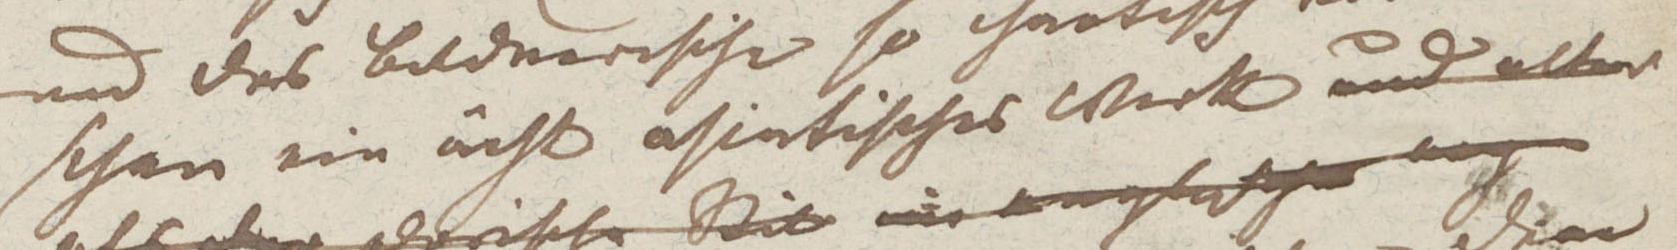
schen ein ächt asiatisches Werk und alter
